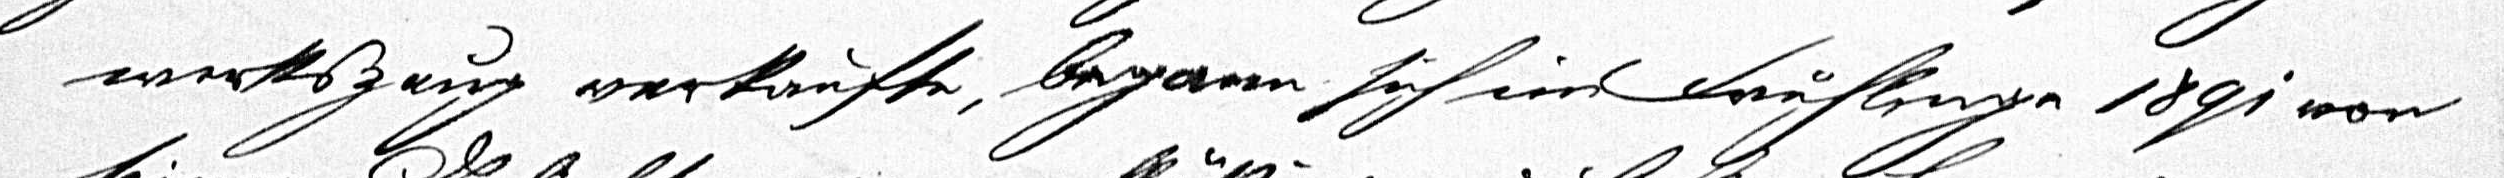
werkzeug verkaufte, begann sich in Frühlinge 1891 von
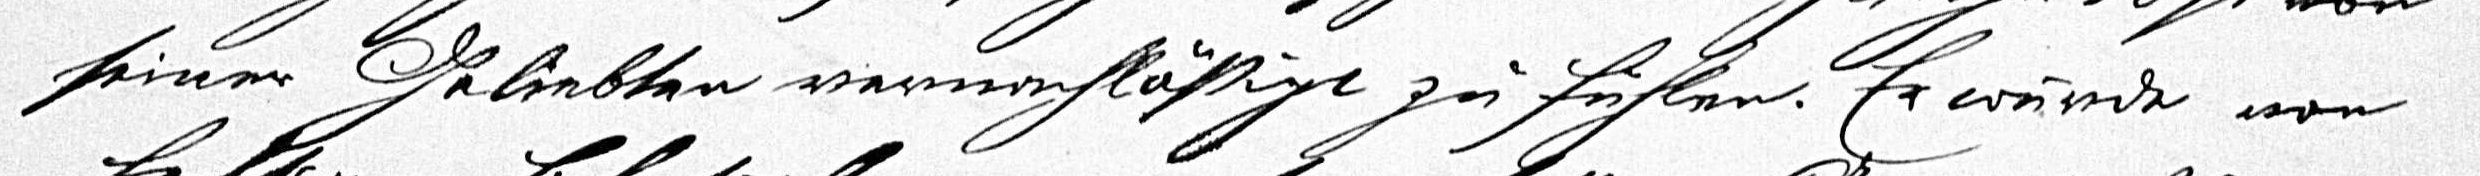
seiner Geliebten vernachläßigt zu fühlen. Er wurde von
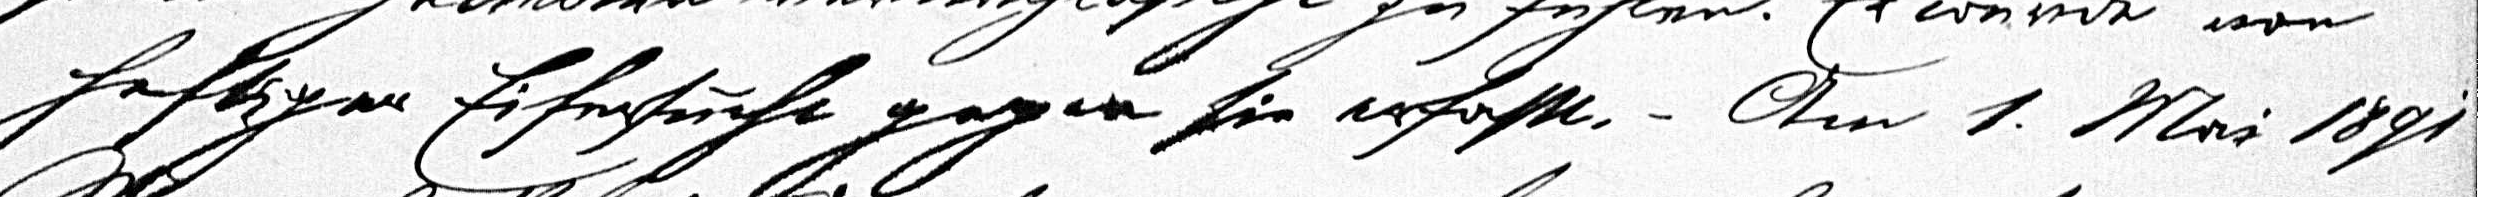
heftiger Eifersucht gegen sie erfaßt. Am 1. Mai 1891
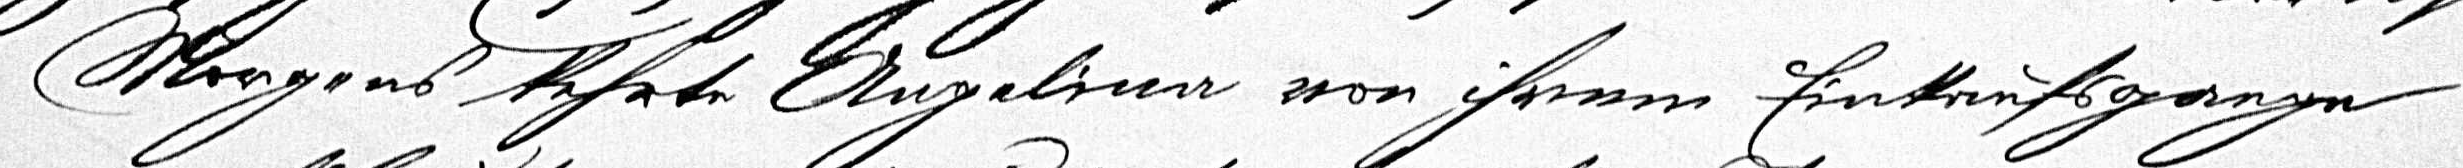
Morgens kehrte Angelina von ihrem Einkaufsgange
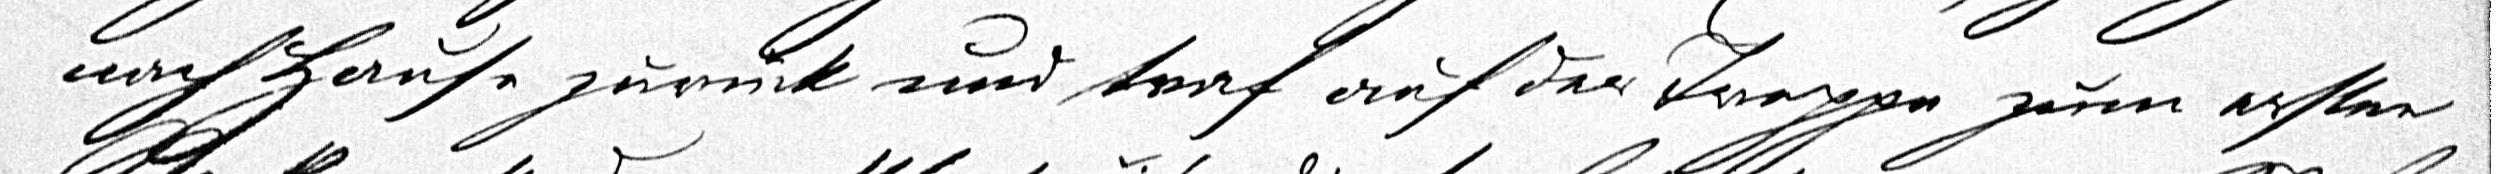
nach Hause zurück und traf auf der Treppe zum ersten
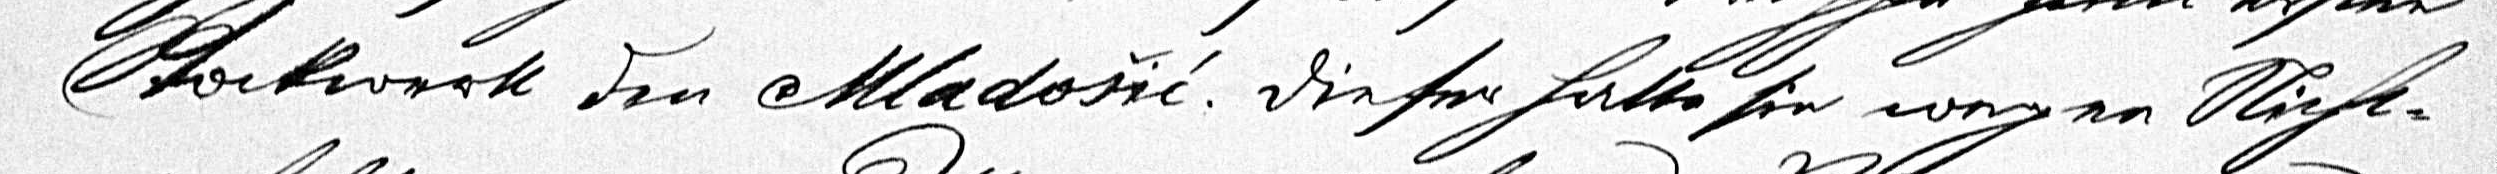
Sotckwerk den Mladošić. Dieser hatte sie wegen Nicht¬
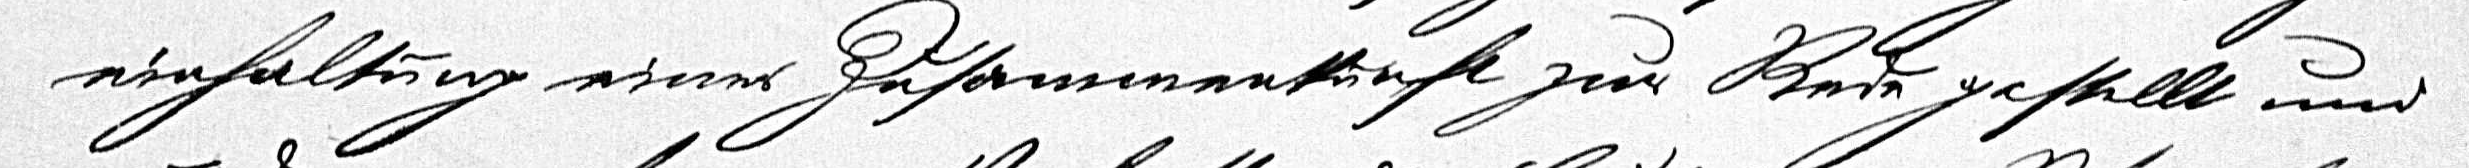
einhaltung einer Zusammenkunft zur Rede gestellt und
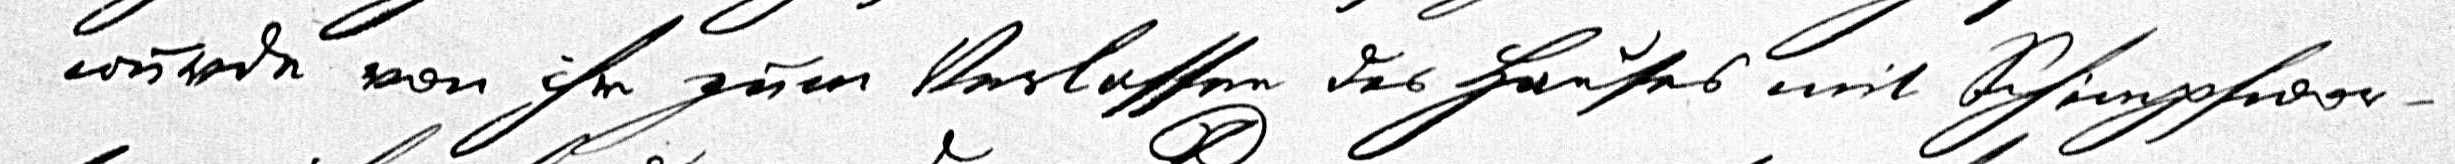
wurde von ihr zum Verlassen des Hauses mit Schimpfwor¬
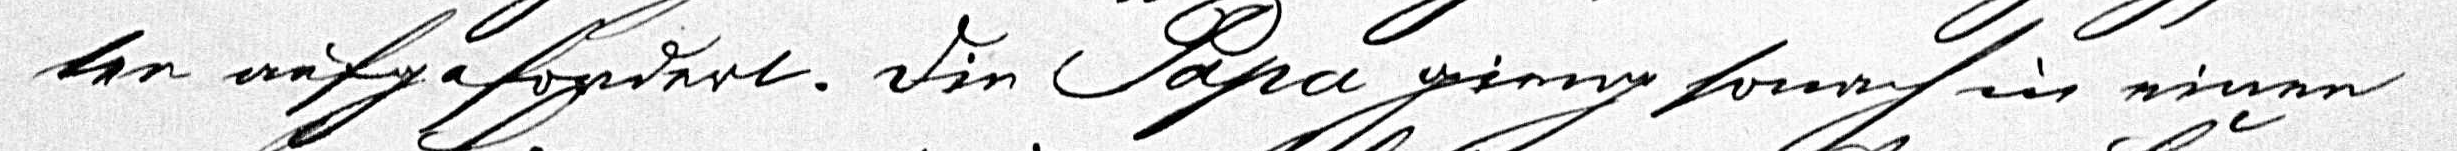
ten aufgefordert. Die Papa gieng sonach in einen
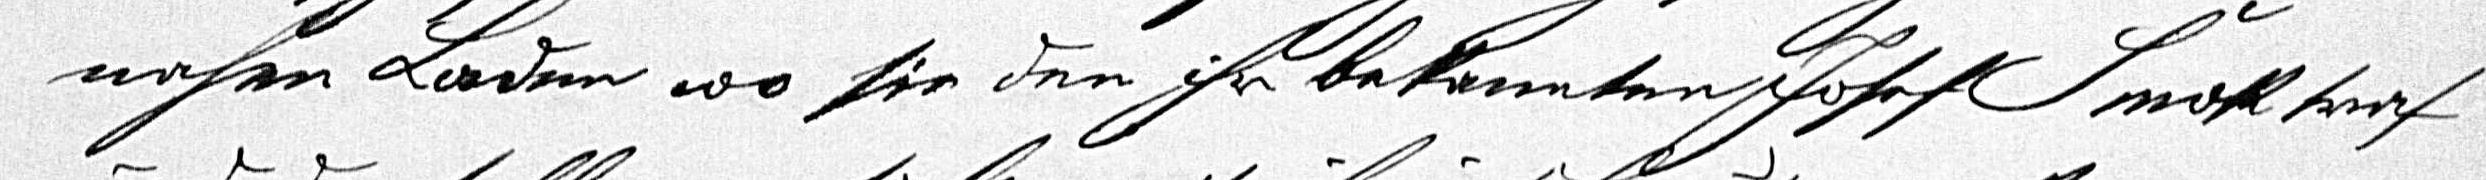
nahen Laden wo sie den ihr bekannten Josef Šmok traf
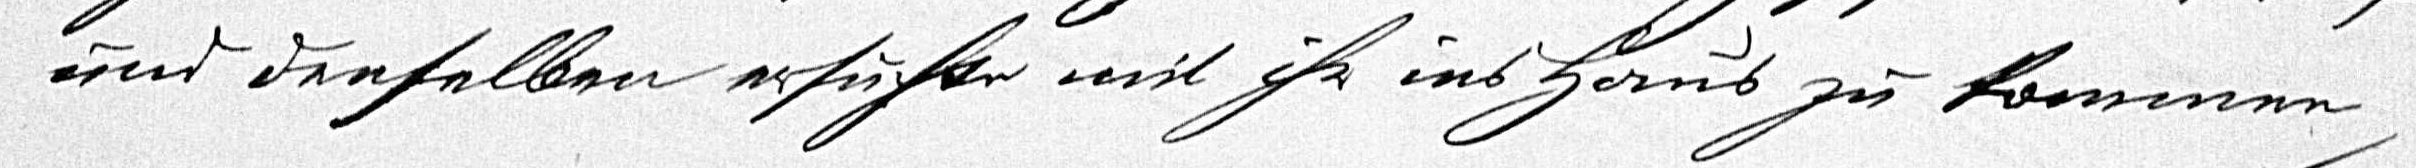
und denselben ersuchte mit ihr ins Haus zu kommen
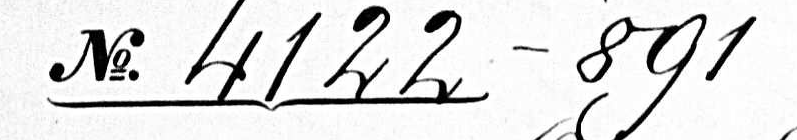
No. 4122 - 1891
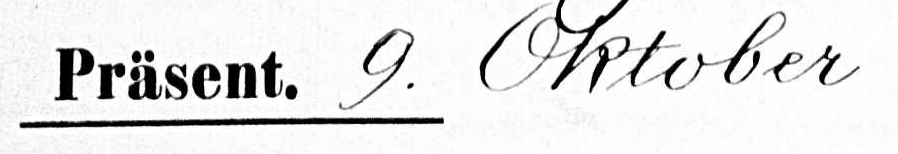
Präsent. 9. Oktober
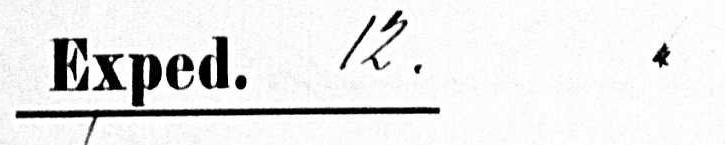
Exped. 12. „
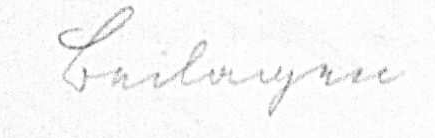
Beilagen
